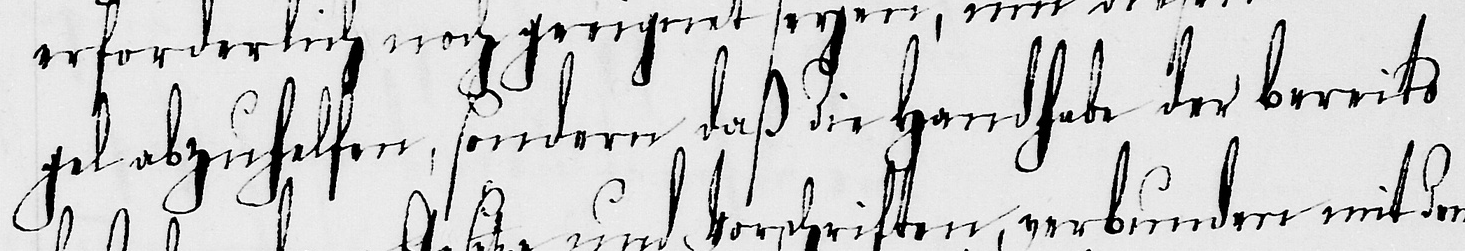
gel abzuhelfen, sondern daß die Handhabe der bereits
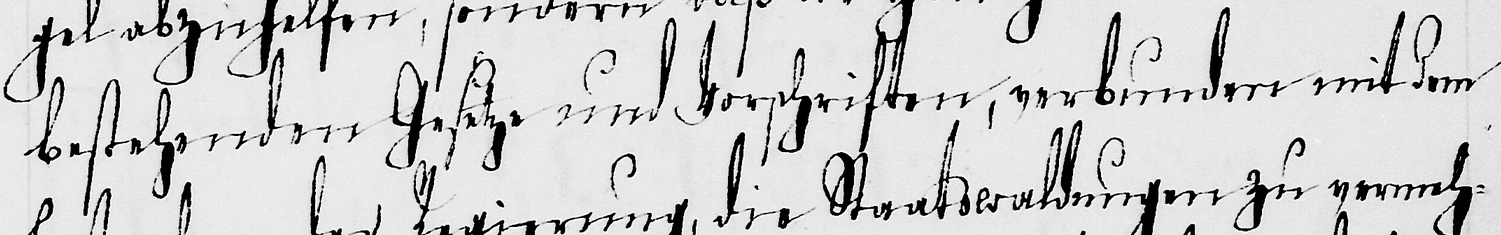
bestehenden Gesetze und Vorschriften, verbunden mit dem
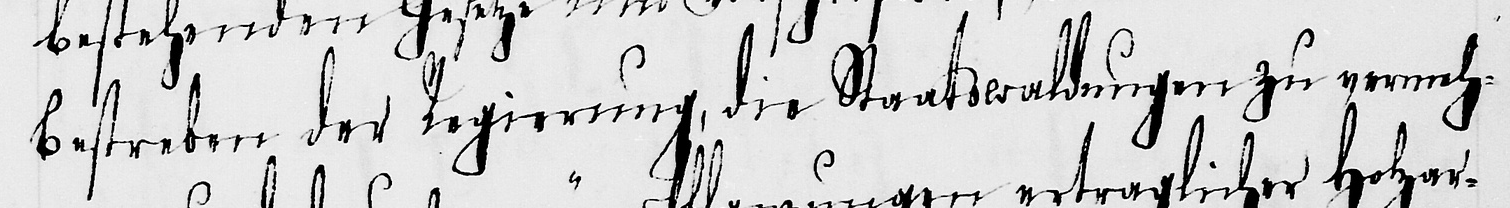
Bestreben der Regierung, die Staatswaldungen zu vermeh¬
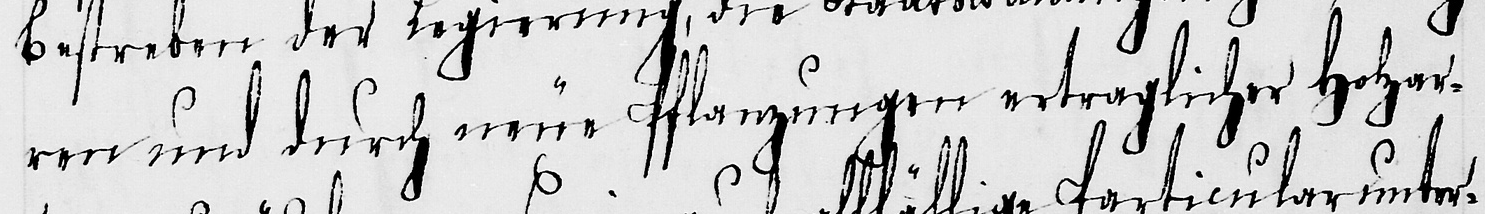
ren und durch neue Pflanzungen ertraglicher Holzar¬
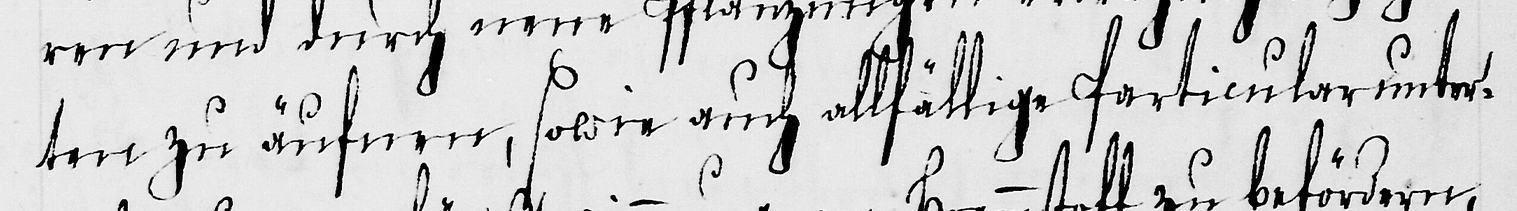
ten zu äufnen, sowie auch allfällige Particularunter¬
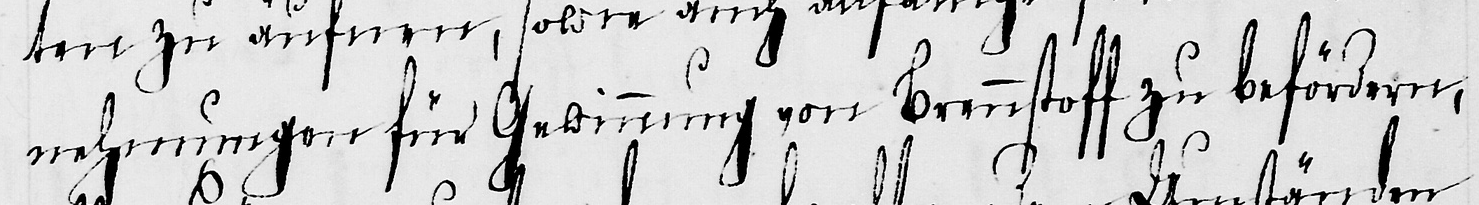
nehmungen für Gewinnung von Brennstoff zu befördern,
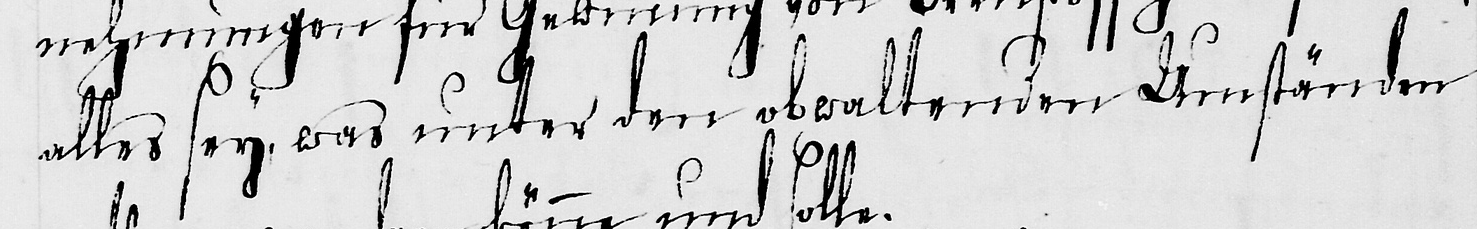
alles sey, was unter den obwaltenden Umständen
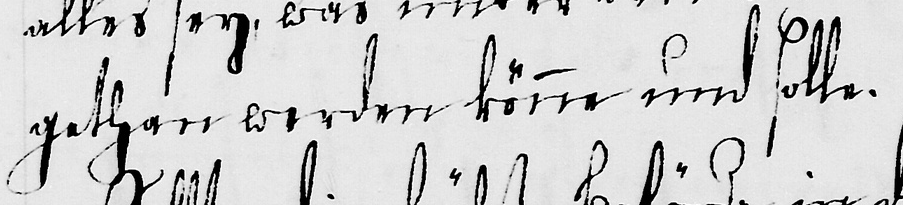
gethan werden könne und solle.
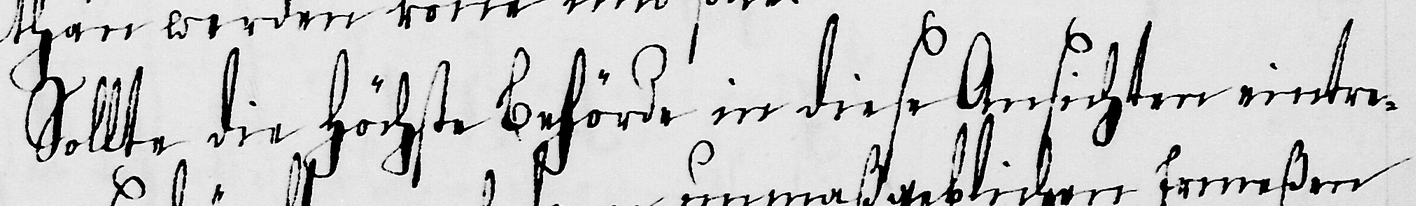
Sollte die Höchste Behörde in diese Ansichten eintre¬
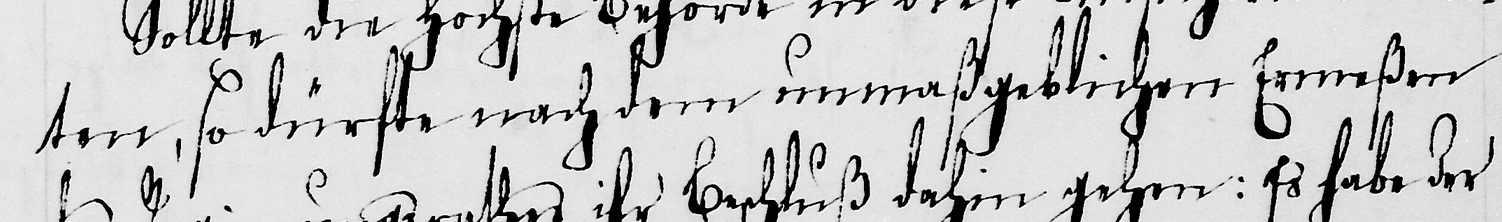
ten, so dürfte nachdem unmaßgeblichen Ermeßen
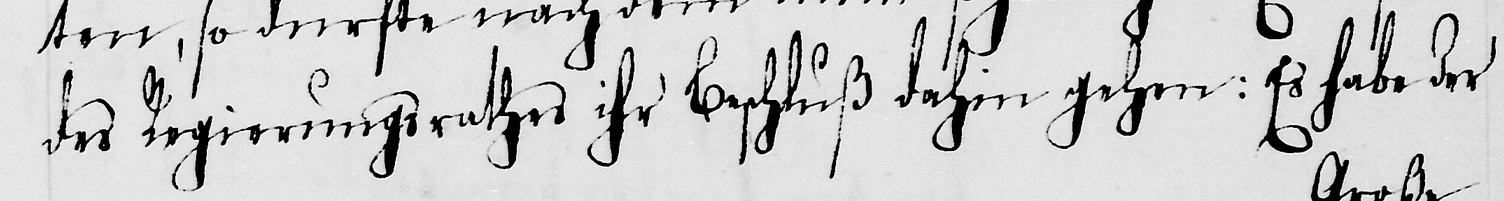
des Regierungsrathes ihr Beschluß dahin gehen: Es habe der
